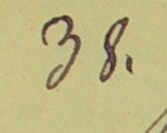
38
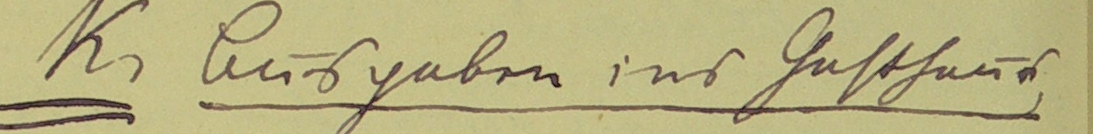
K.) Ausgaben ins Gasthaus,
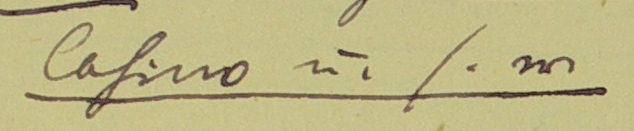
Casino u.s.w
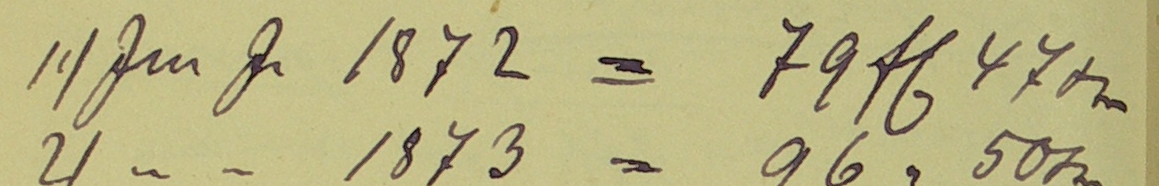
1.) Im Jahr 1872 = 79 fl 47 tr
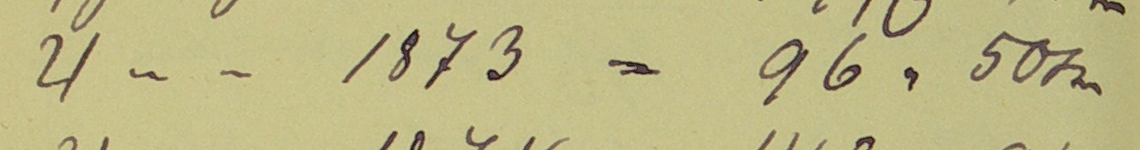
2.) * 1873 = 96 * 50 *
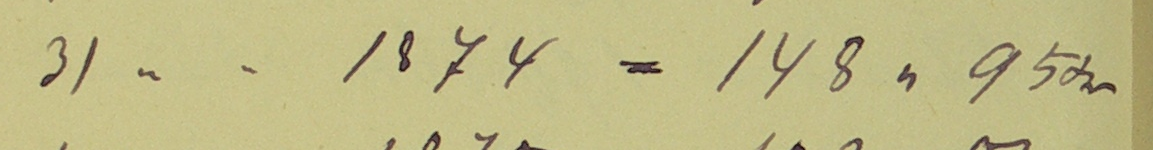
3.) * 1874 = 148 * 95 *
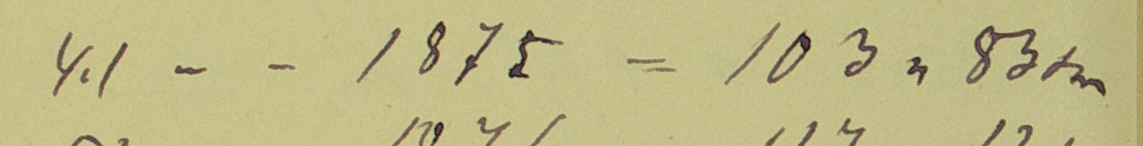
4.) * 1875 = 103 * 83 *
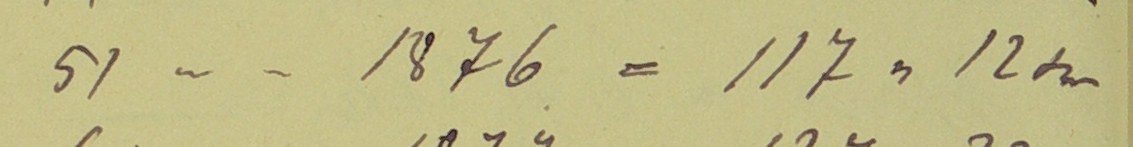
5.) * 1876 = 117 * 12 *
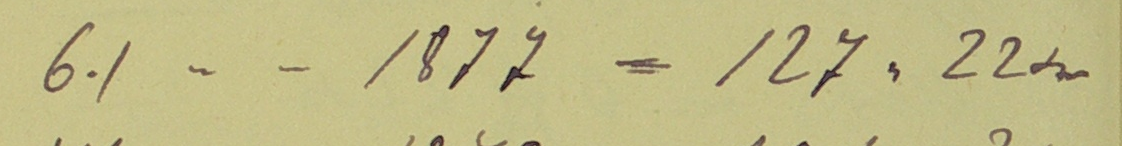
6.) * 1877 = 127 * 22 *
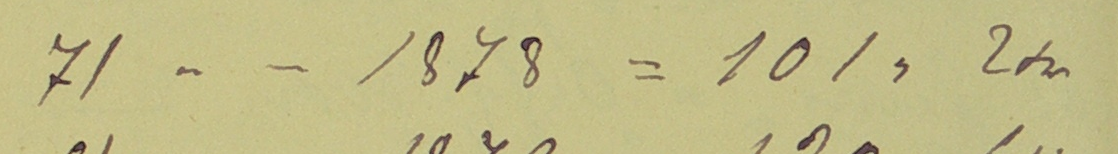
7.) * 1878 = 101 * 2 *
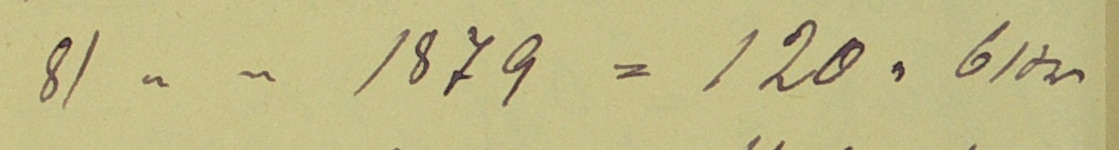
8.) * 1879 = 120 * 61 *
